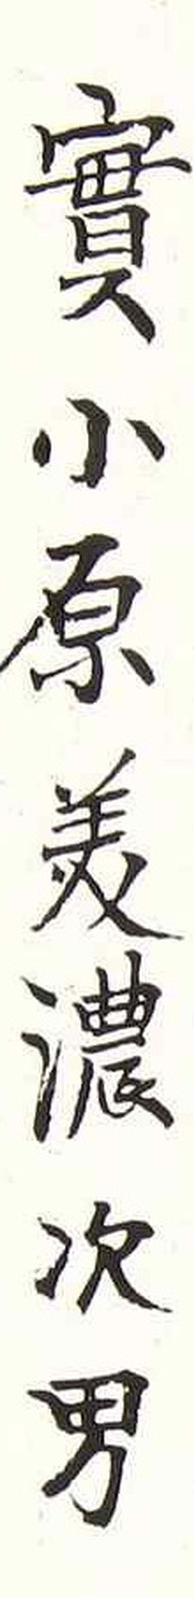実小原美濃次男
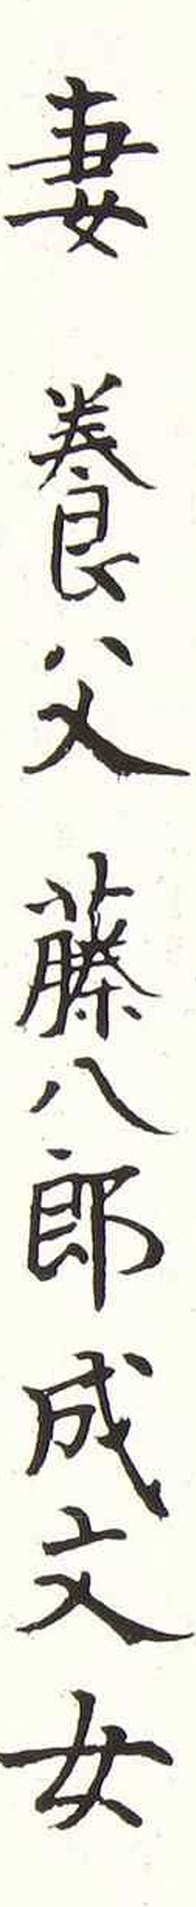妻養父藤八郎成文女
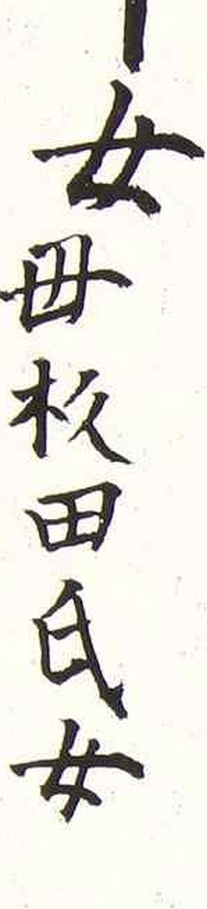母杉田氏女
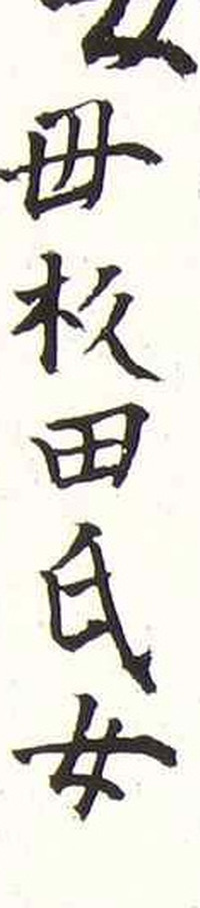母杉田氏女
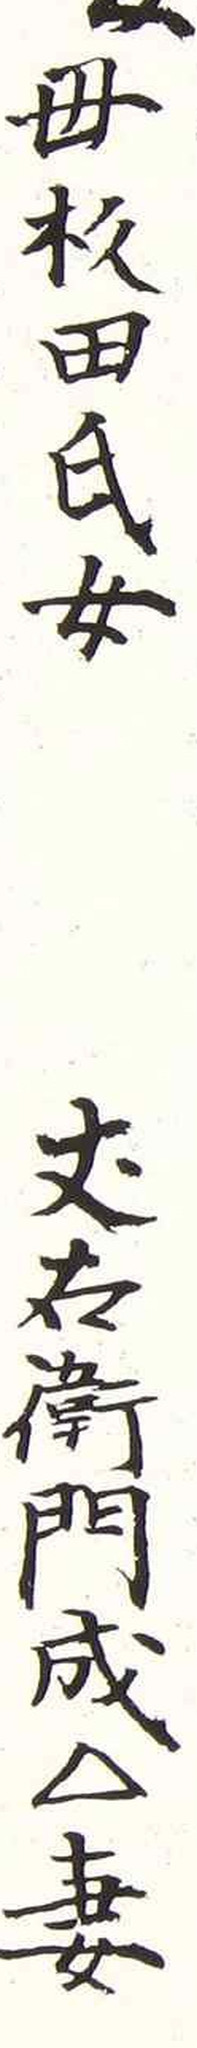母杉田氏女丈右衛門成△妻
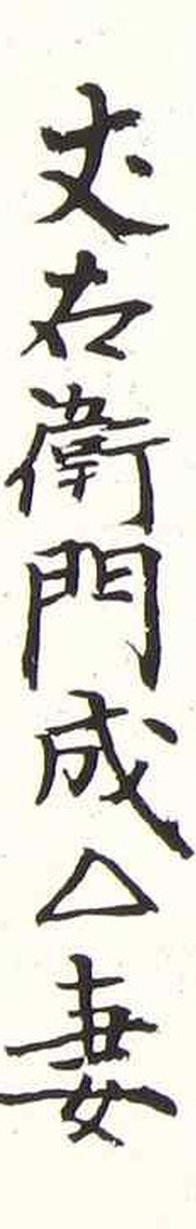丈右衛門成△
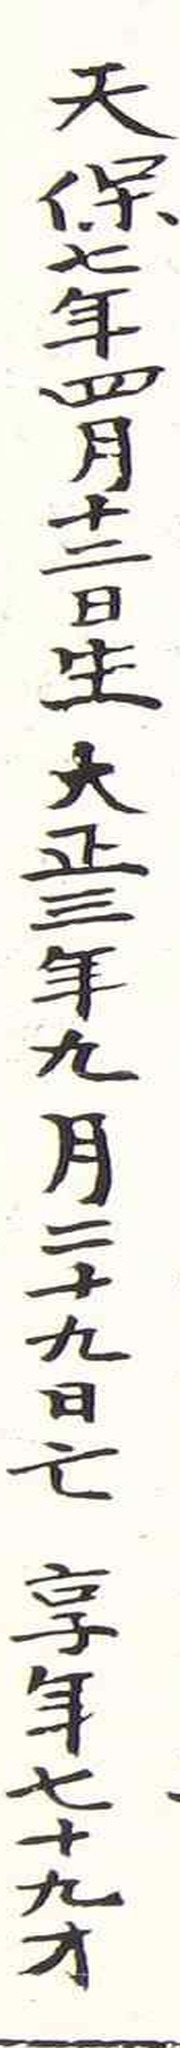天保七年四月十二日生大正三年九月二十九日亡享年七十九才
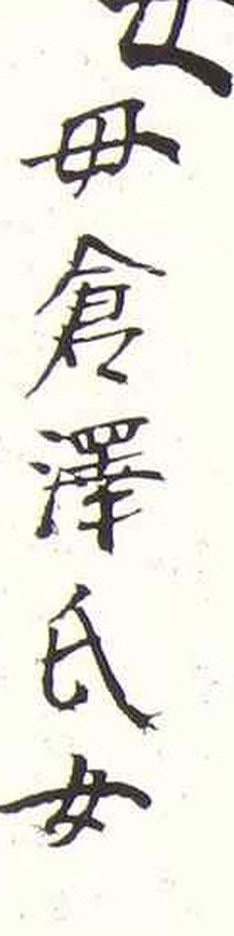母倉沢氏女

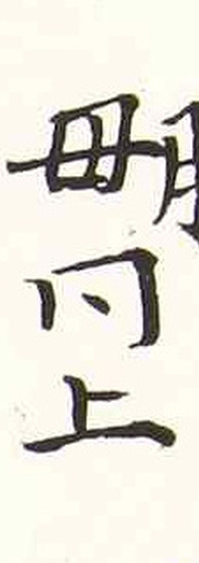母同上
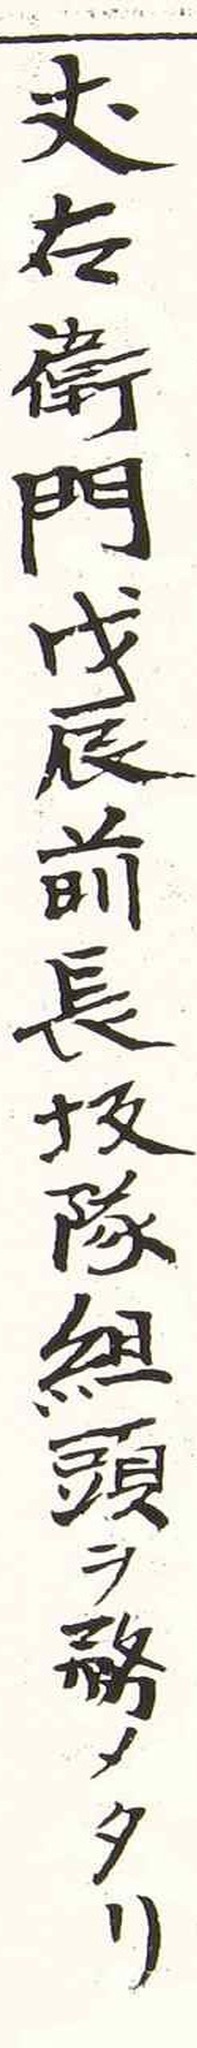丈右衛門戊辰前長坂隊組頭ヲ務メタリ
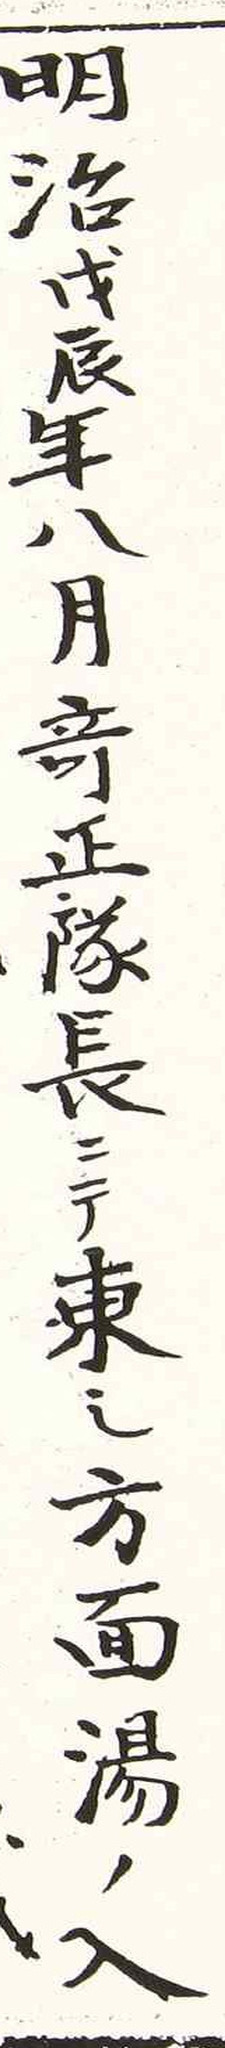明治戊辰年八月奇正隊長ニテ東之方面湯ノ入
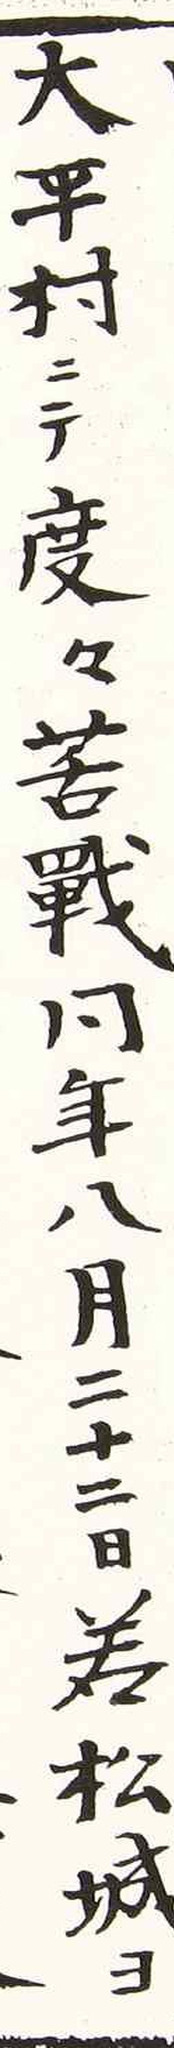大平村ニテ度々苦戦同年八月二十二日若松城ヨ
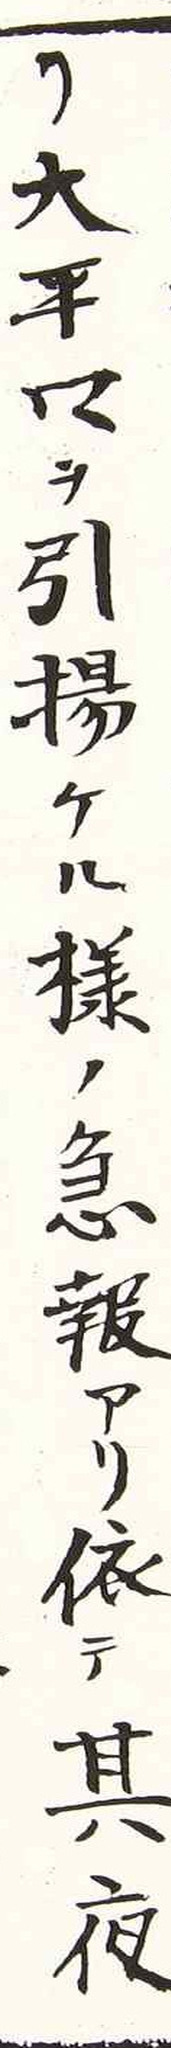リ大平口ヲ引揚ケル様ノ急報アリ依テ其夜
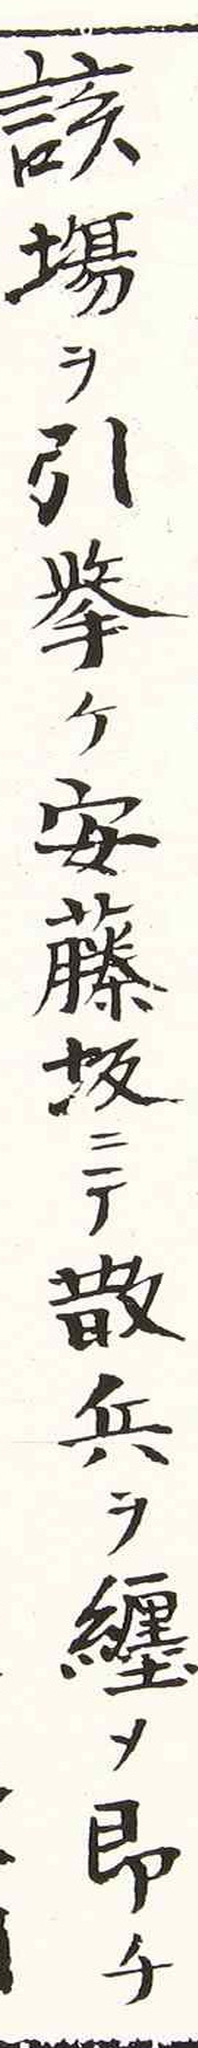該場ヲ引挙ケ安藤坂ニテ散兵ヲ纏メ即チ
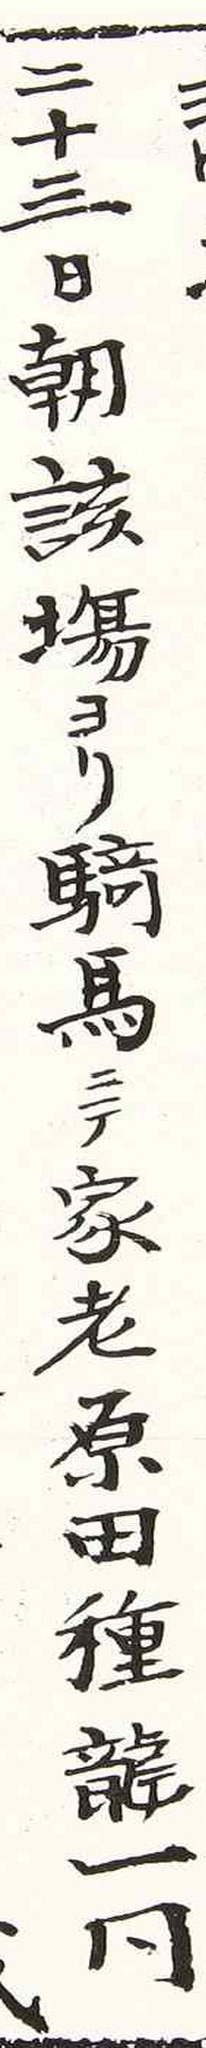二十三日朝該場ヨリ騎馬ニテ家老原田種龍一同
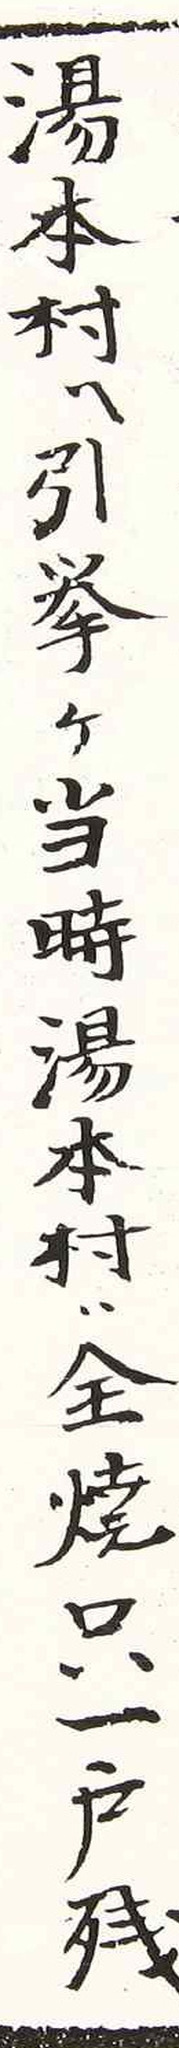湯本村へ引挙ケ当時湯本村ハ全焼只一戸残
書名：諸士系譜　巻之357　す之部7
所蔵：会津若松市立会津図書館
